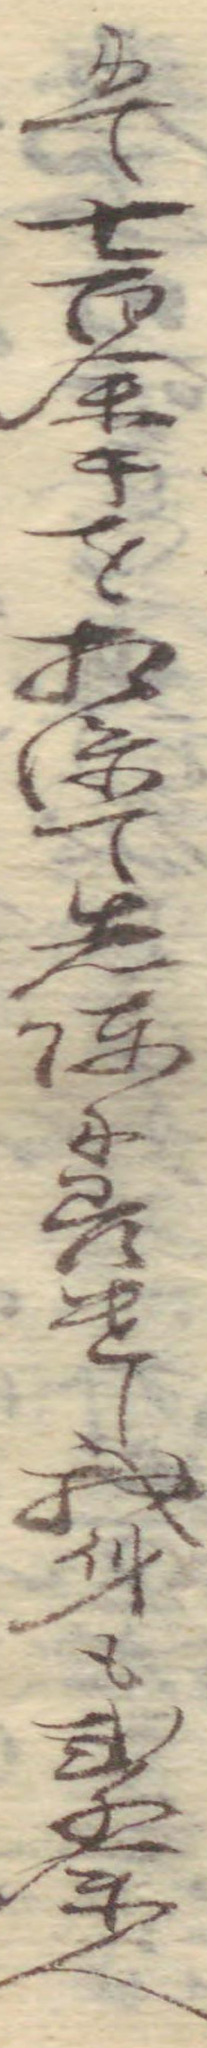にて七百余キを相添て先陣に差遣し我身も弐千余人
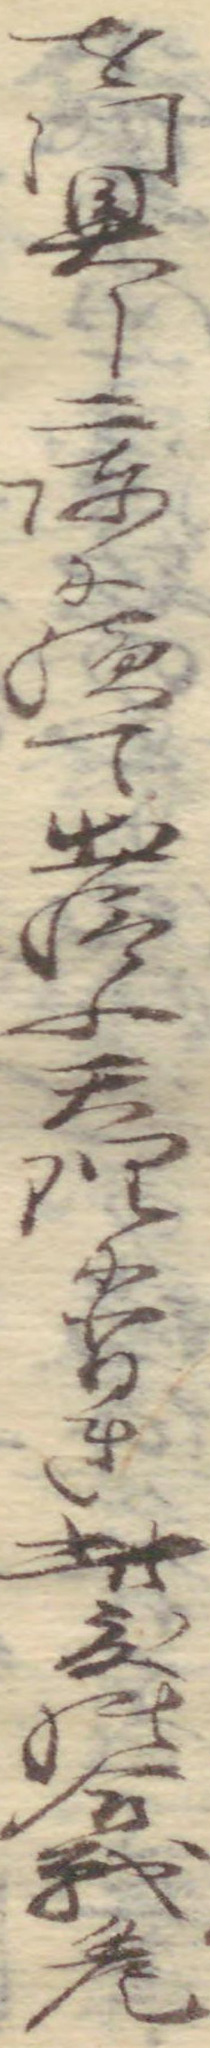を引具し二陣に頒て出給ふ天理に背き此度の合戦危
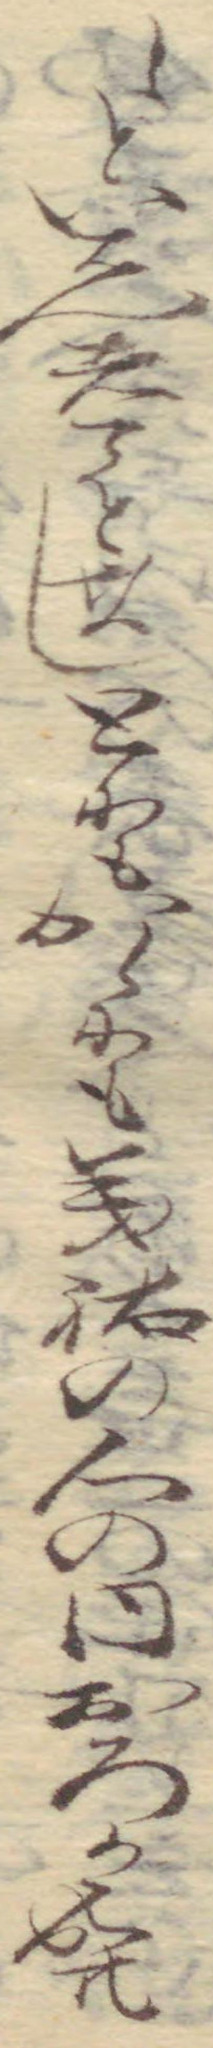しといはん者こそなしとにもかくにも義祐の心の内おろか成共
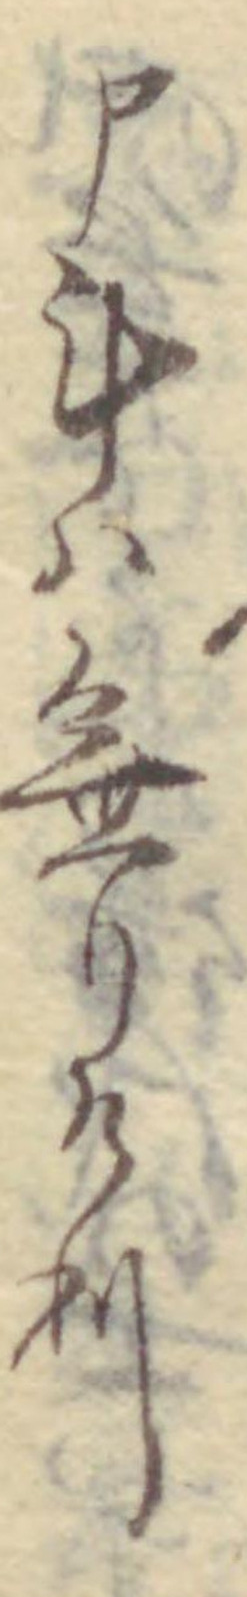申斗は無りけり
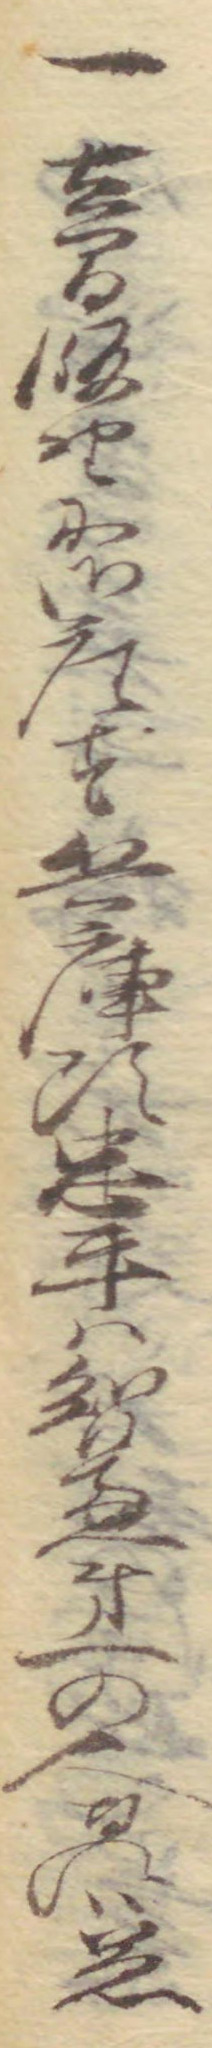一去間飯野に御座す兵庫頭忠平は智恵第一の人なれは兼
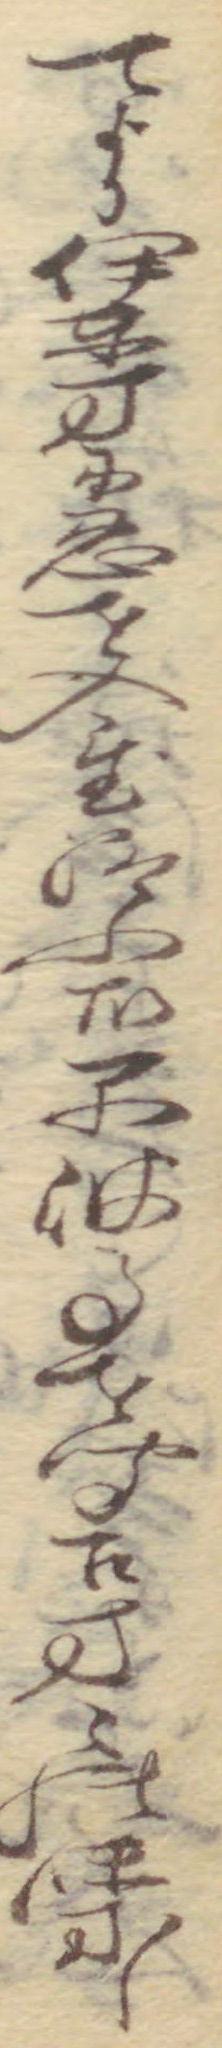てより伊東方に忍を入置給う故早彼事を聞召方々の味方〳〵
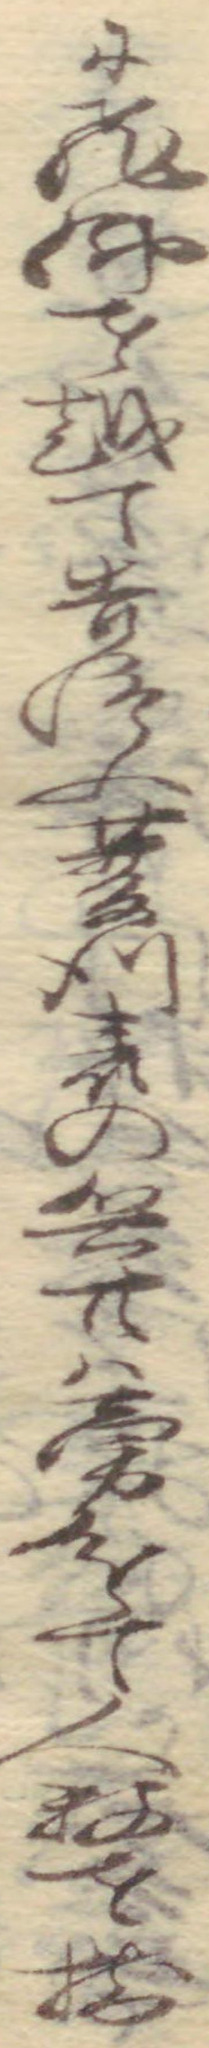に飛脚を越て告給ふ菱刈表の兵共は勇進て人数を揃
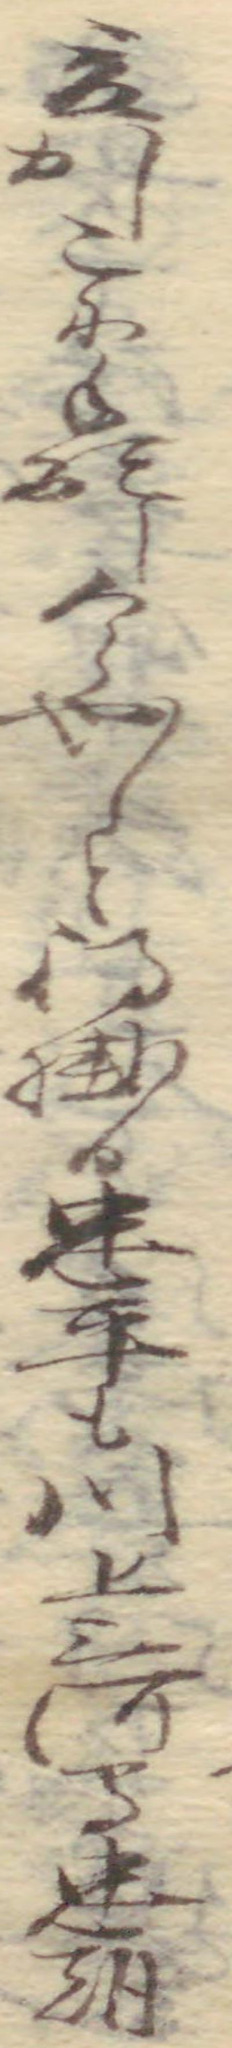爰かしこに手配し今や〳〵と待掛る忠平も川上三河守忠朝
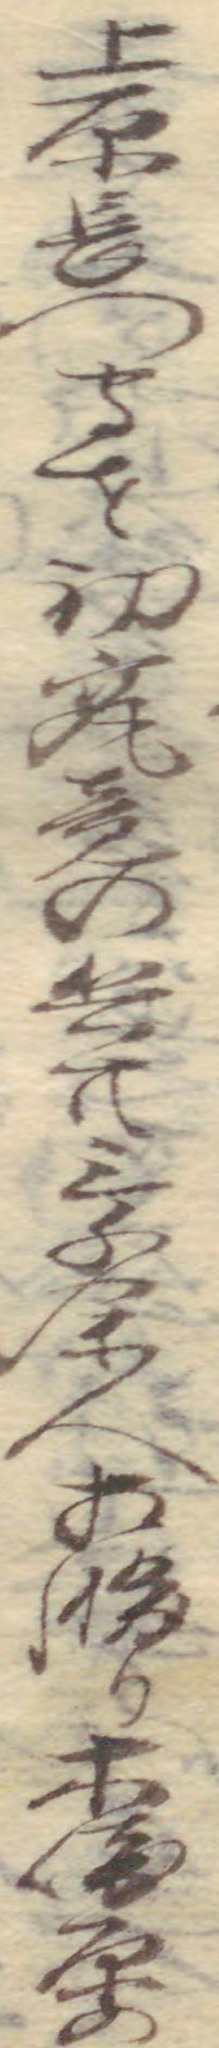上原長門守を初究竟の兵共三千余人相勝り木崎原の
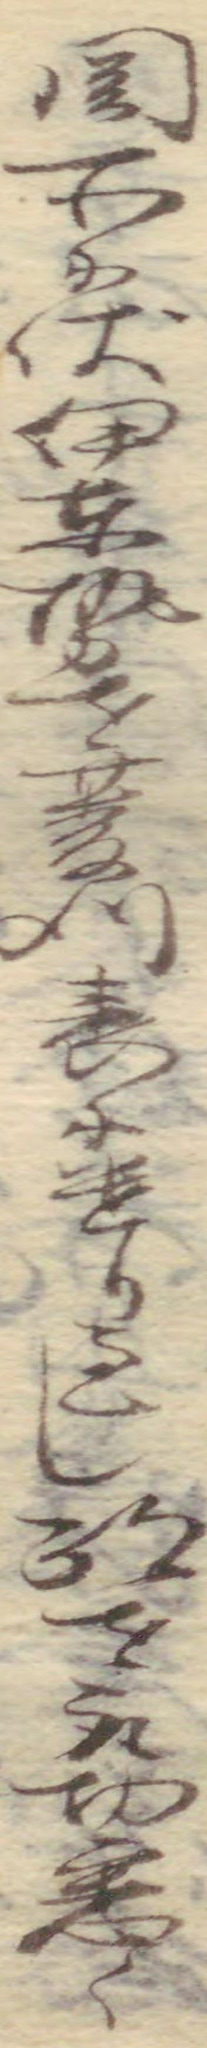関所に伏伊東勢を菱刈表に遣り過し跡を取切悉く
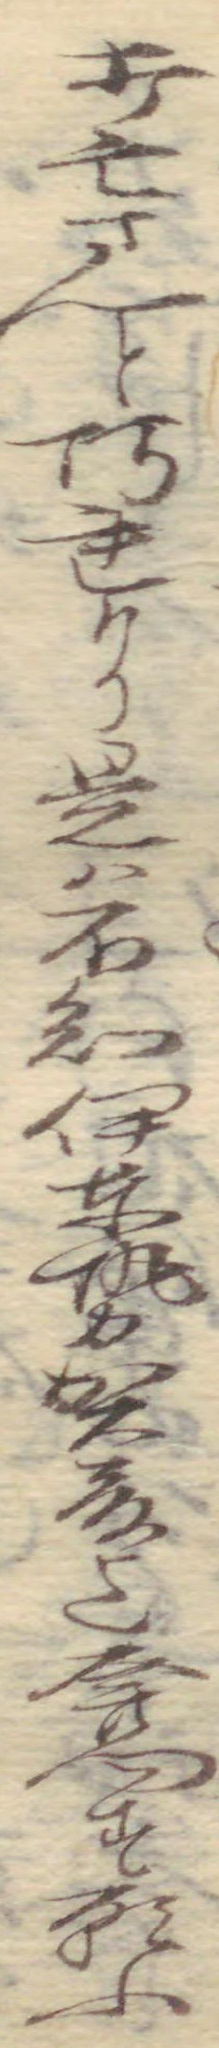打亡さんと巧れけり是は不知伊東勢賀藤迄発向す願ふ
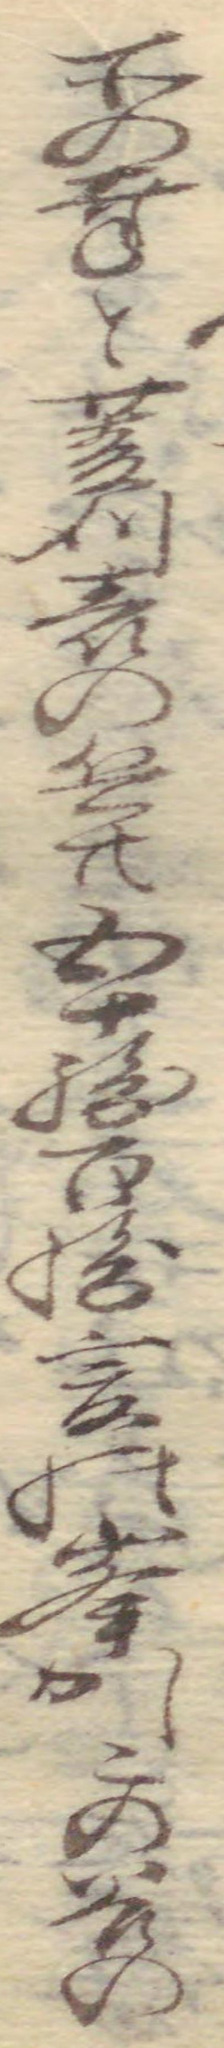所の幸と菱刈表の兵共五十騎百騎爰の峯かしこの谷の
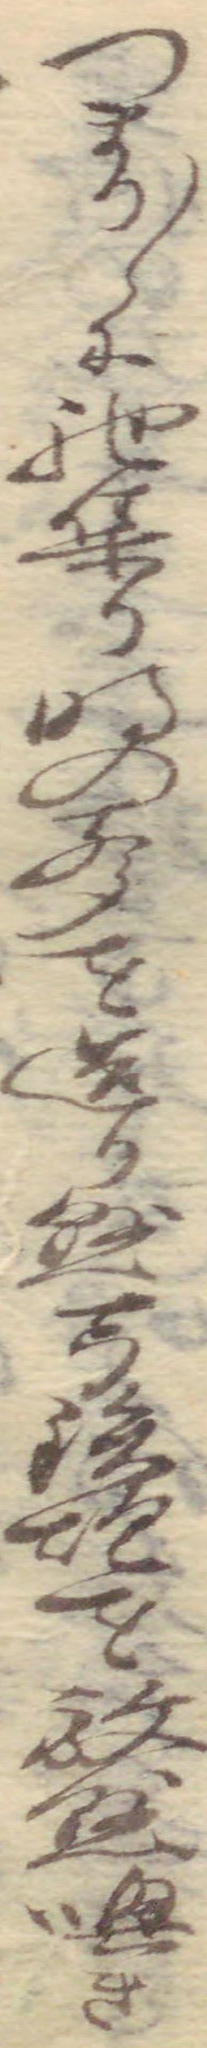つまり〳〵に馳せ集り時の声を造り懸弓鉄炮を放懸喚き
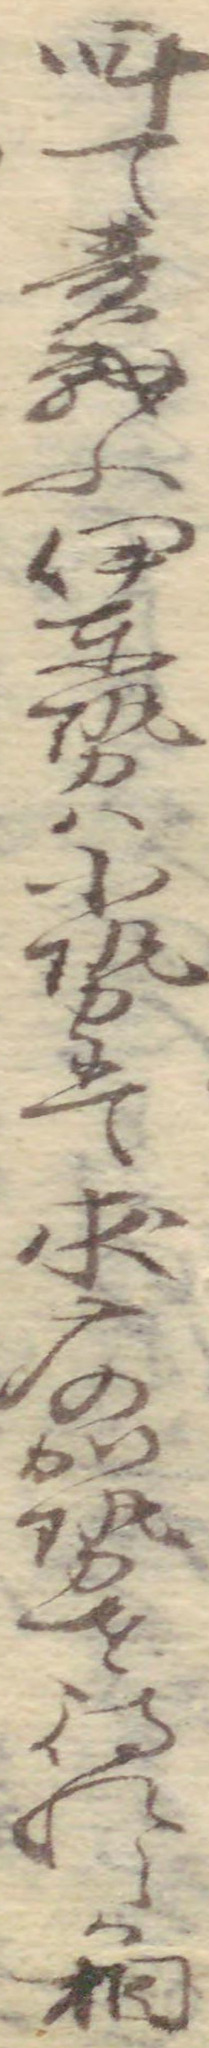叫て責戦ふ伊東勢は小勢にて求摩の加勢を待れしか相
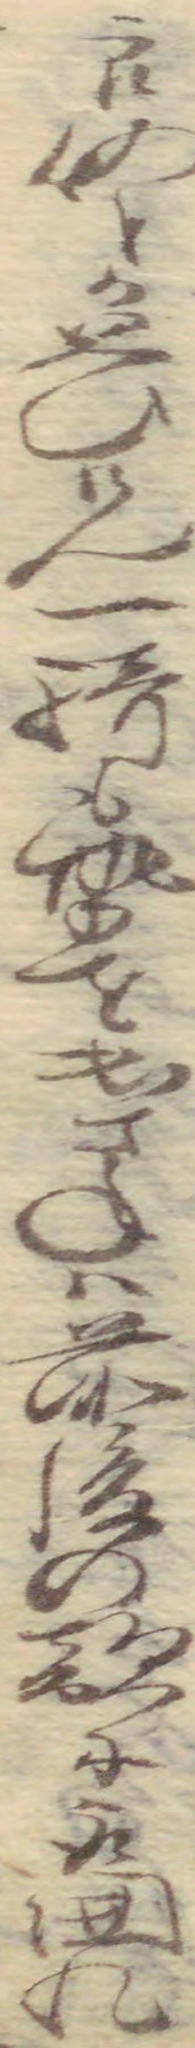良何とか思ひけん一騎も勢を出さねは前後の敵に取囲れ
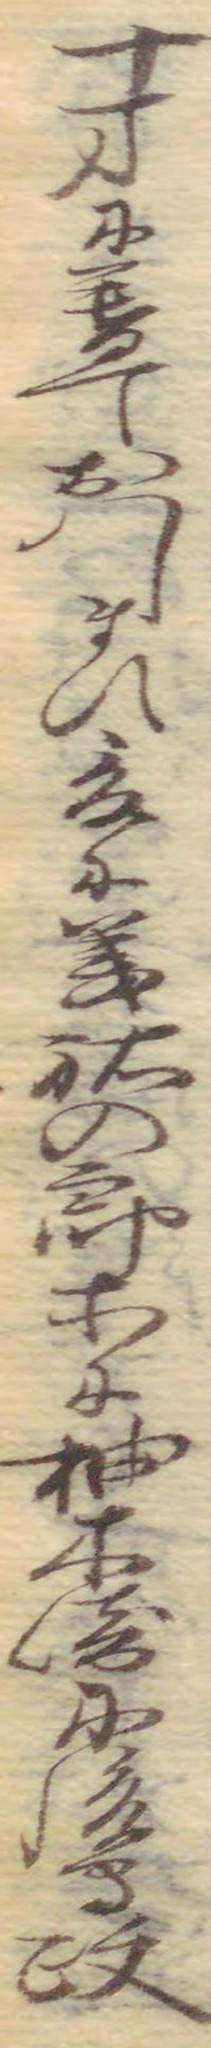十方に暮ておはします爰に義祐の郎等に柚木埼丹後守政
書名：鶯宿雑記. 巻199-200
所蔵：国立国会図書館 National Diet Library, JAPAN
